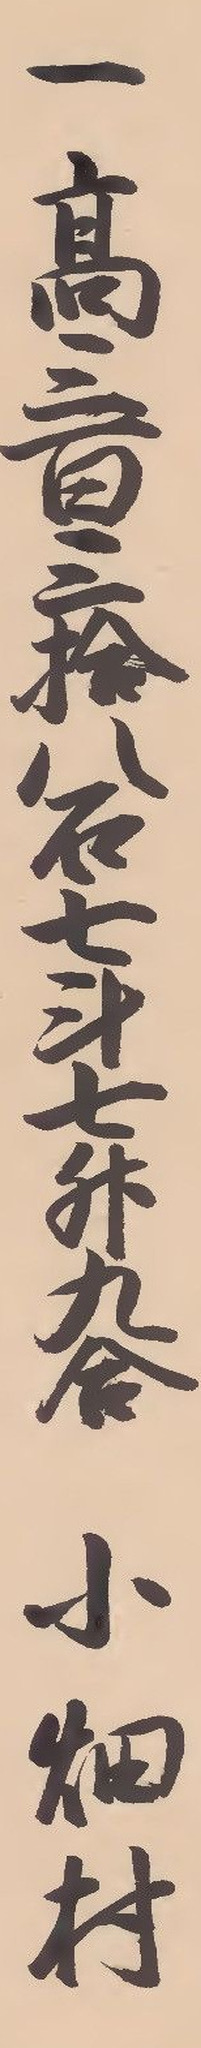一高三百三拾八石七斗七升九合小畑村
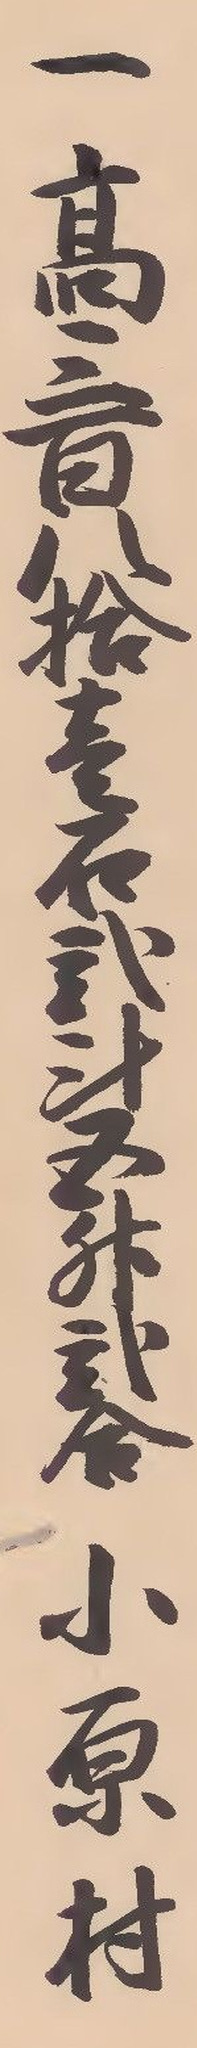一高三百八拾壱石弐斗五升弐合小原村

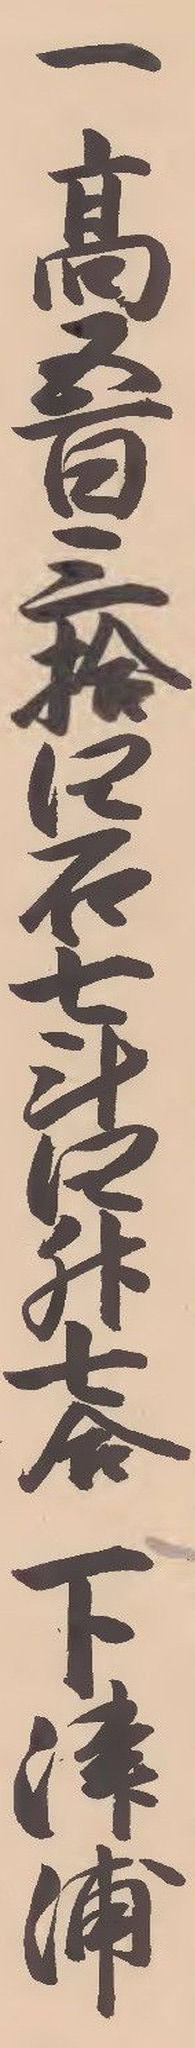一高五百三拾四石七斗四升七合下津浦
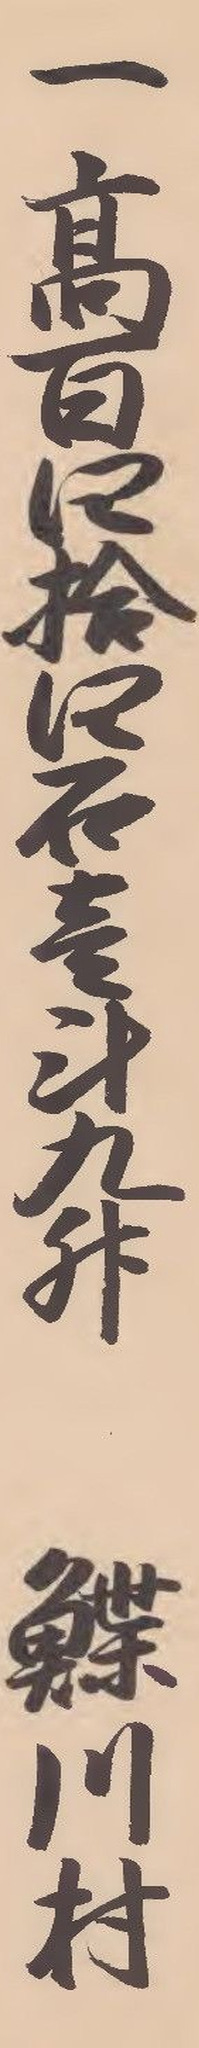一高百四拾四石壱斗九升鰈川村
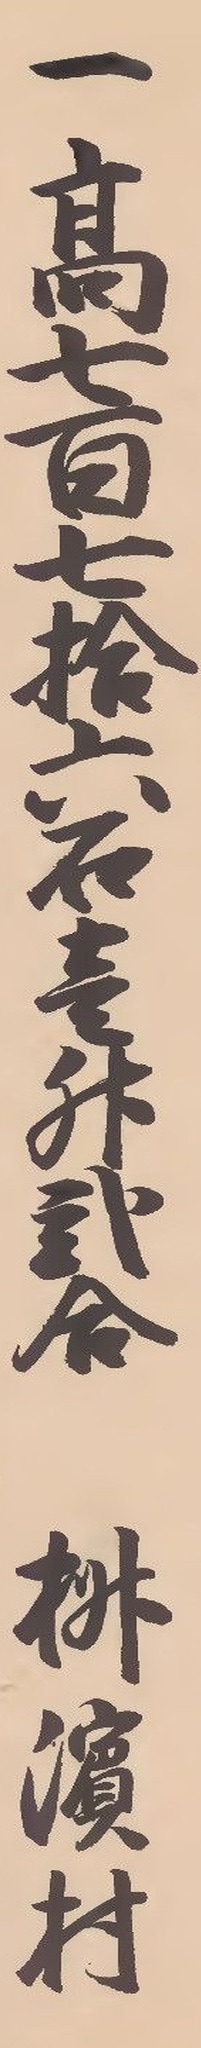一高七百七拾六石壱升弐合枡浜村
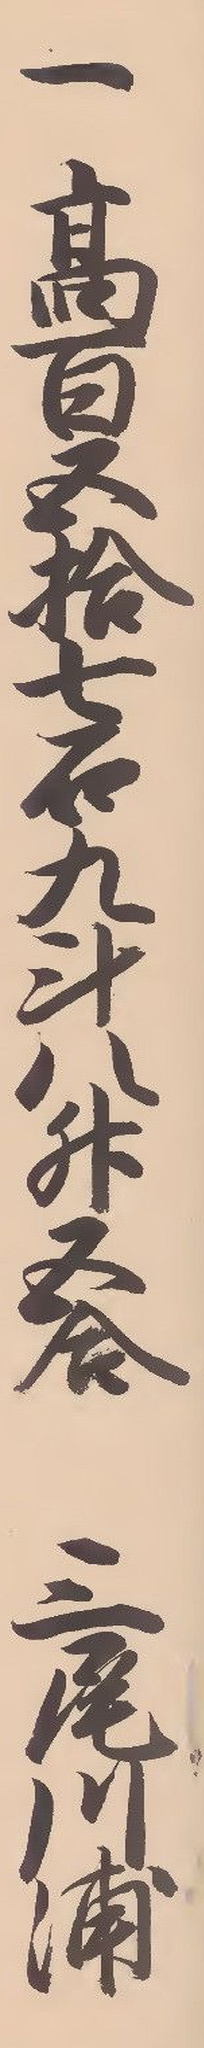一高百五拾七石九斗八升五合三尾川浦
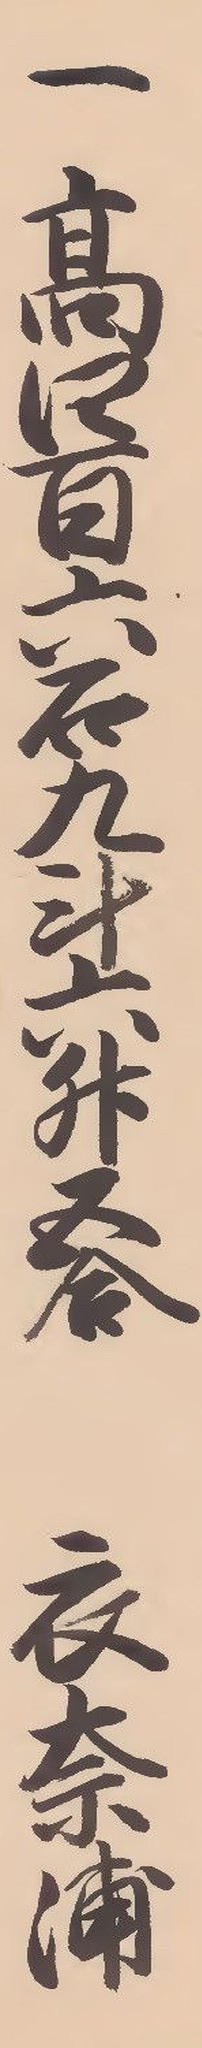一高四百六石九斗六升五合衣奈浦
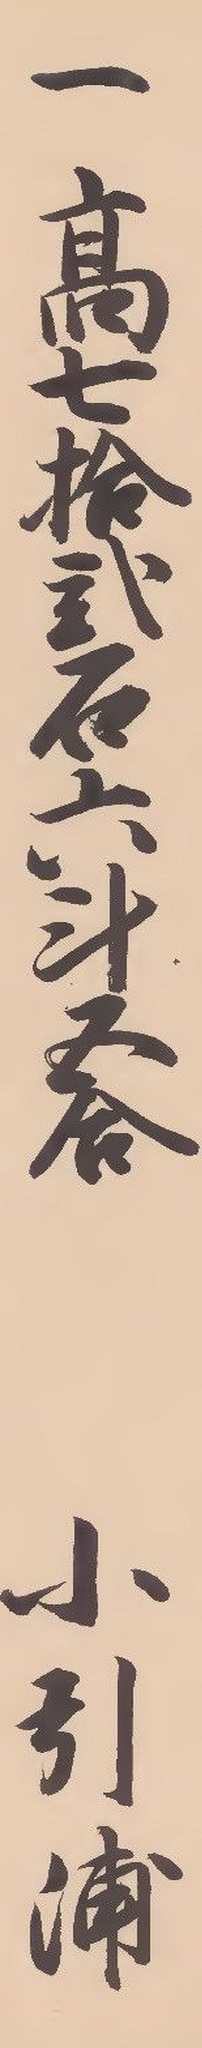一高七拾弐石六斗五合小引浦
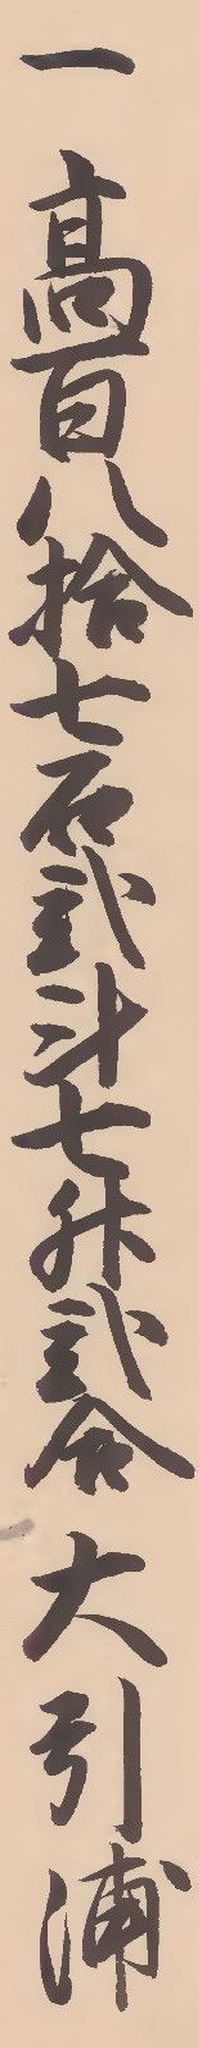一高百八拾七石弐斗七升弐合大引浦

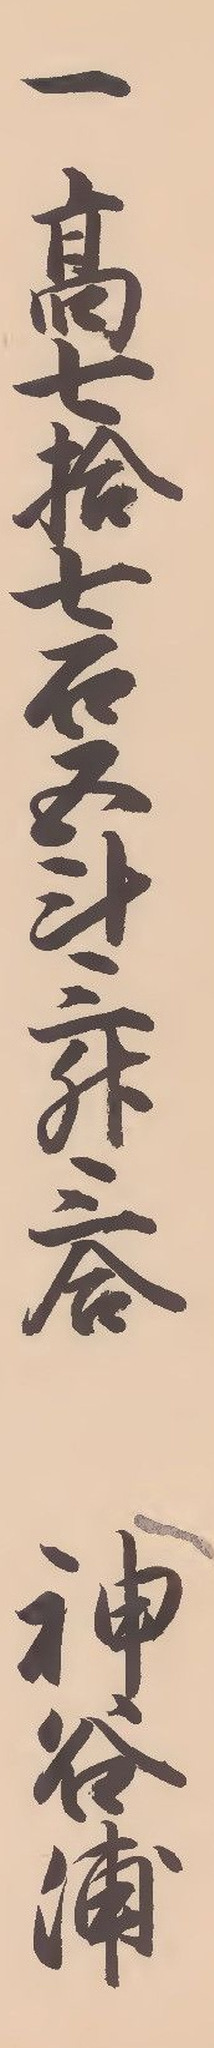一高七拾七石五斗三升三合神谷浦
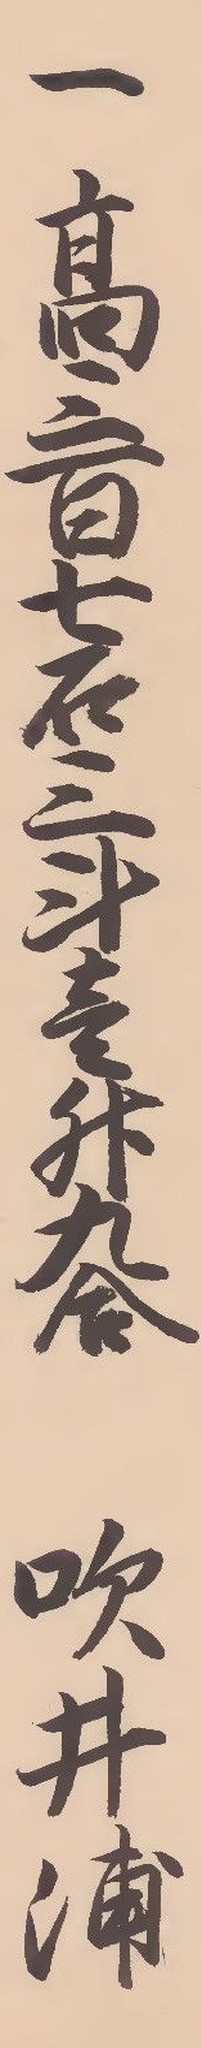一高三百七石三斗壱升九合吹井浦
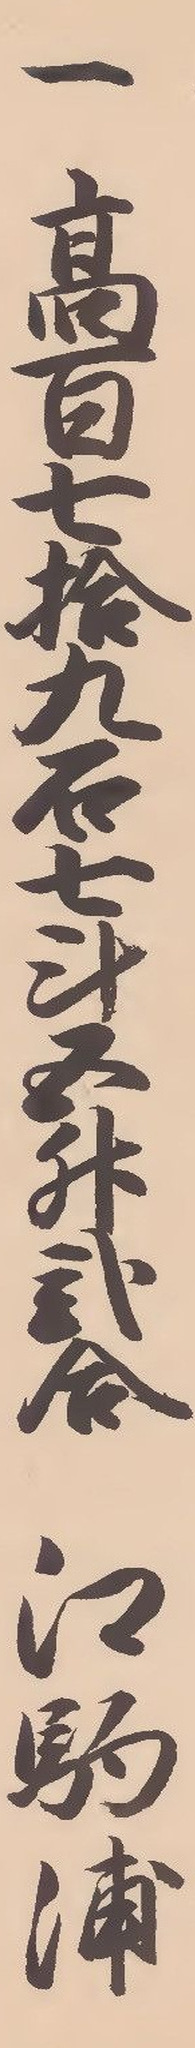一高百七拾九石七斗五升弐合江駒浦
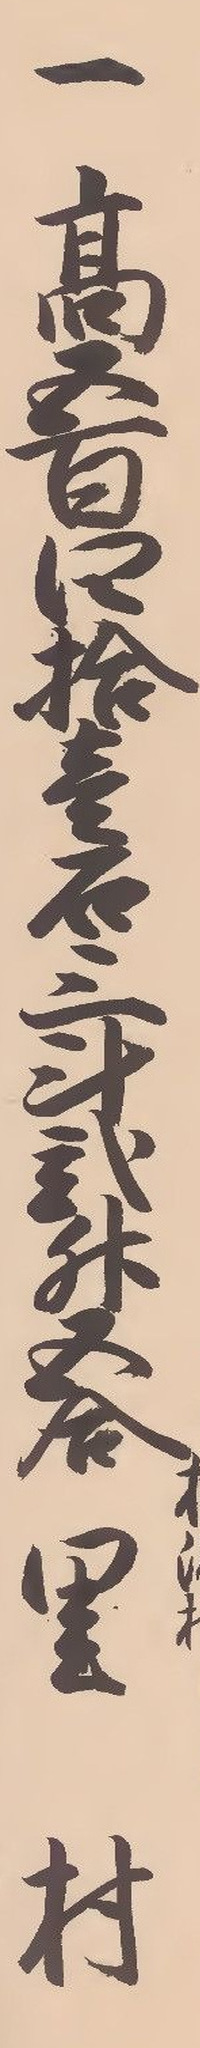一高五百弐拾八石三斗弐升九合畑村
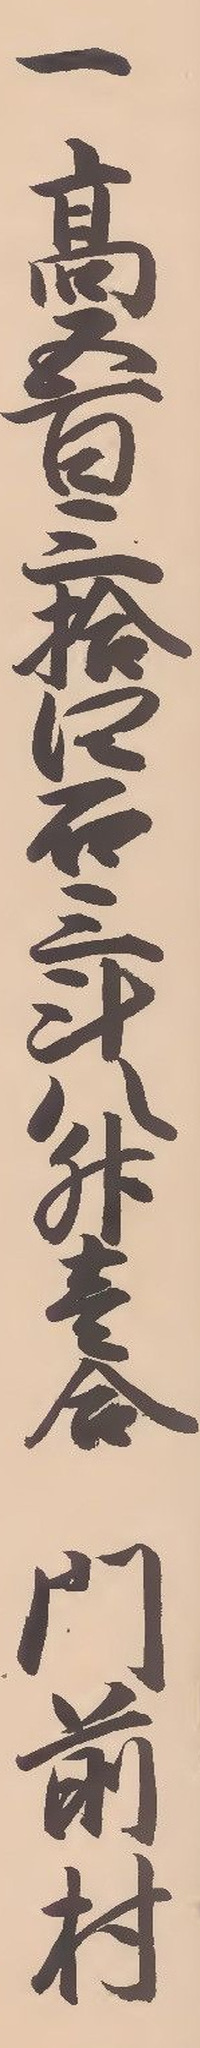一高五百三拾四石三斗八升壱合門前村
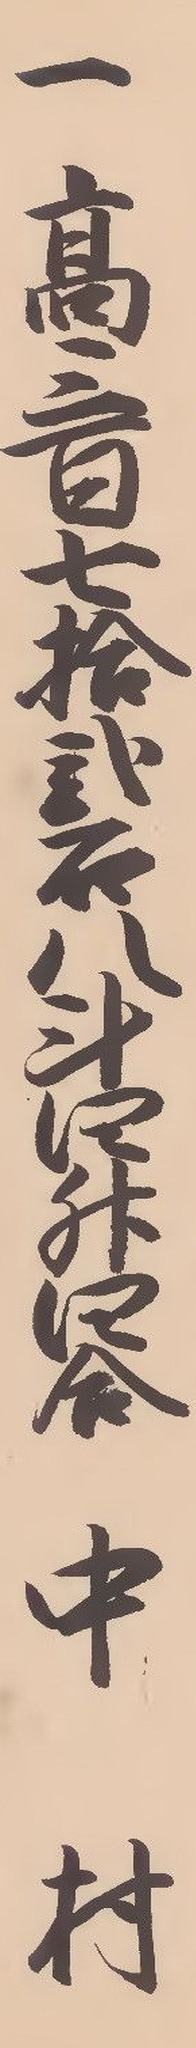一高三百七拾弐石八斗四升四合中村
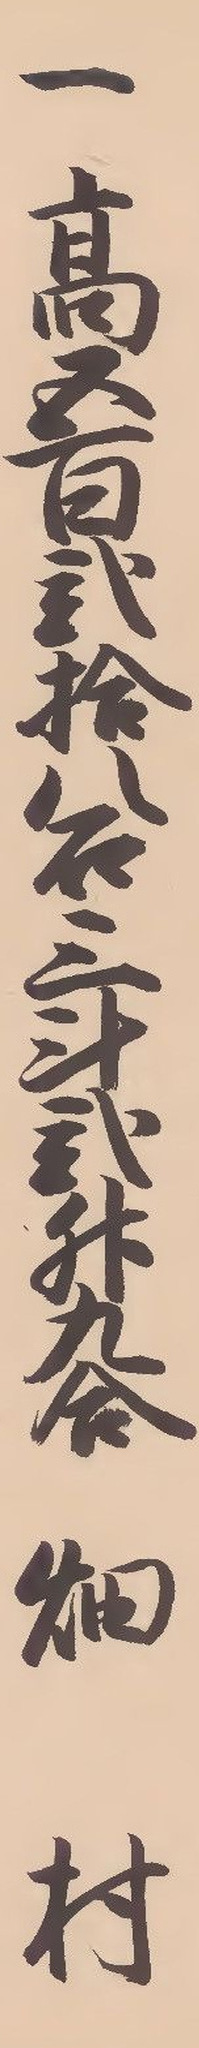一高五百弐拾八石三斗弐升九合畑村
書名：紀伊国郷帳
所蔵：国立公文書館 National Archives of Japan
